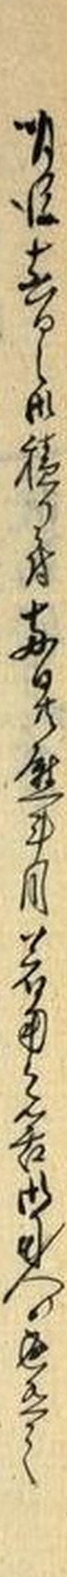明後十六日之御積りニ付両日共熨斗目着用之筈御用人ゟ通有之
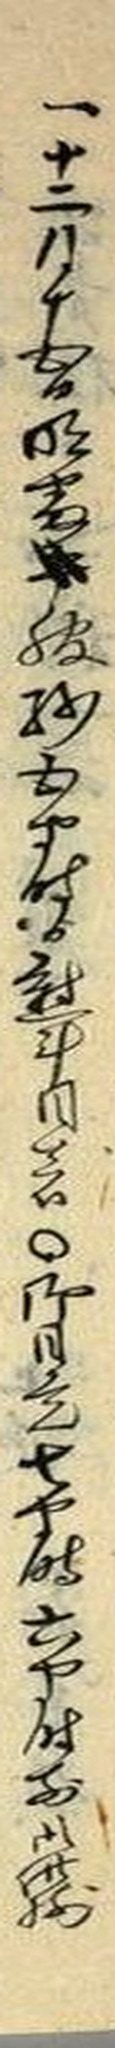一十二月十五日明番服紗五半時ゟ熨斗目着〇御目覚七半時六半時前御供揃
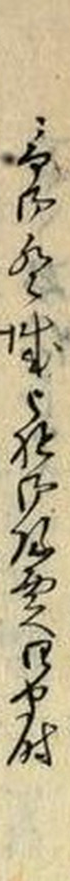ニ而御登城被遊御帰殿四半時
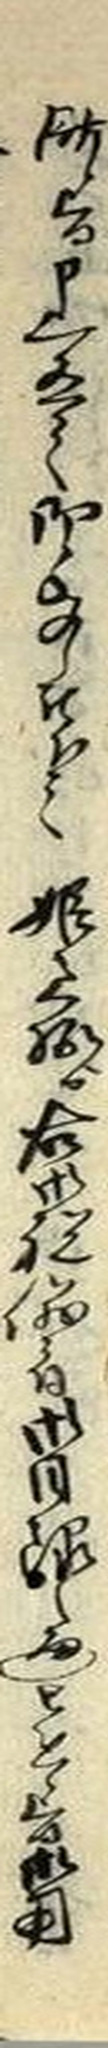済候旨申上有之御手のし被下之姫君様ゟ右御祝儀ニ付御目録之通被進候旨御用
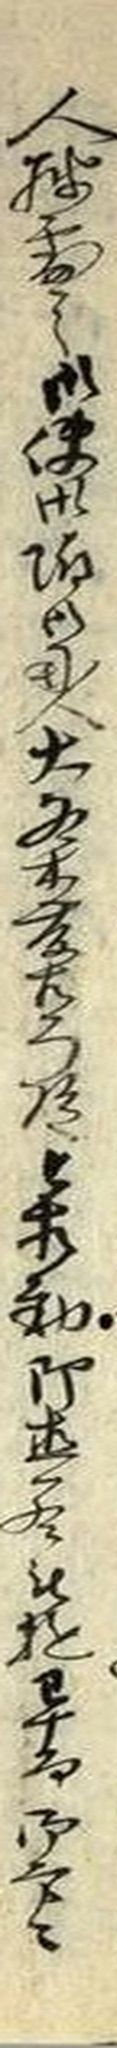人披露之御使御附御用人大谷木藤左衛門殿被相勤御直答被遊畢而御方々
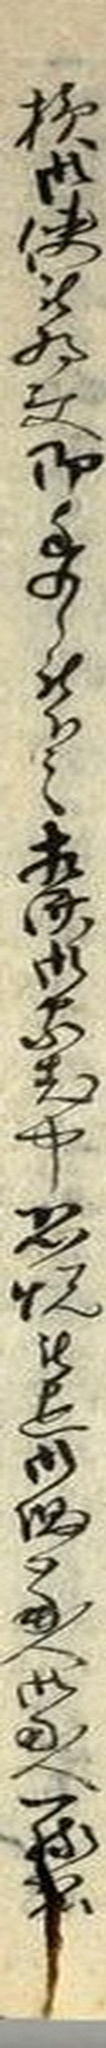様御使被為受御手のし被下之相済御家老中恐悦被申上御側御用人御用人一統恐
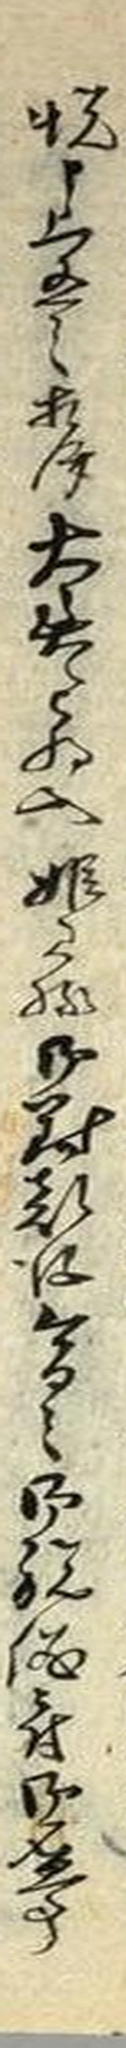悦申上有之相済大奥へ被為入姫君様御対顔後今日之御祝儀ニ付御盃事
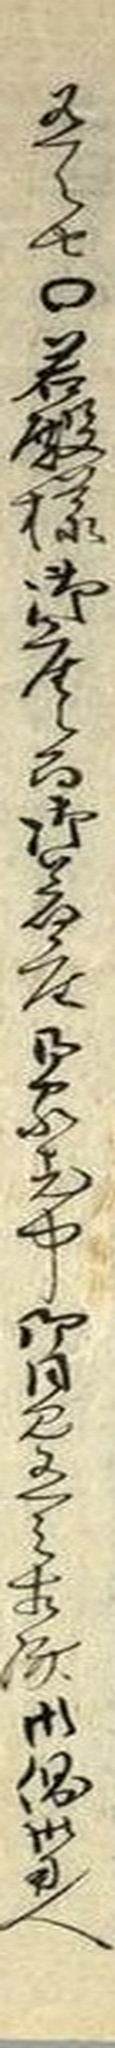有之由○若殿様御座之間御着座御家老中御目見有之相済御側御用人
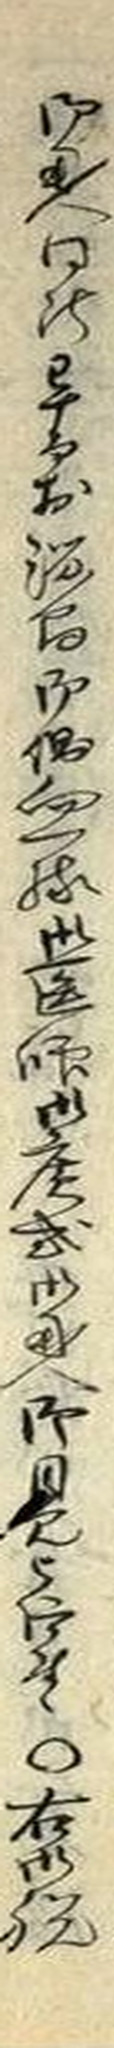御用人同断畢而於溜間御側向一統御医師御広式御用人御目見被仰付候○右御祝
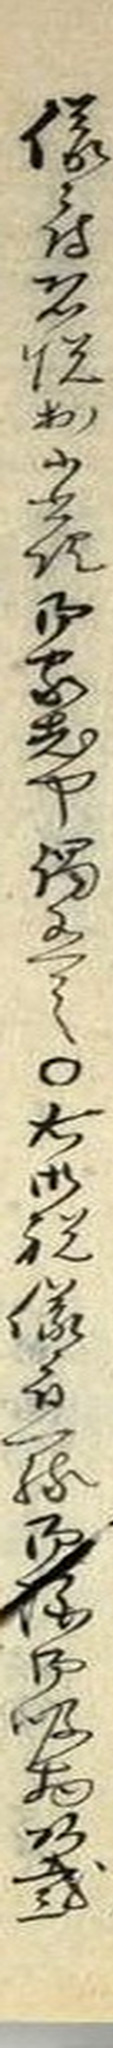儀ニ付恐悦於小書院御家老中謁有之○右御祝儀ニ付一統御酒御吸物頂戴
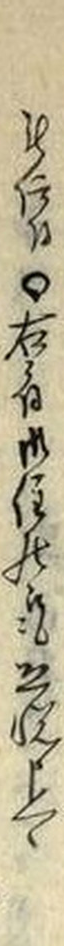被仰付○右ニ付御住居江も恐悦申上候
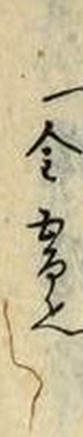金五百疋

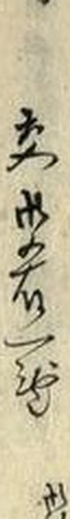交御肴一折
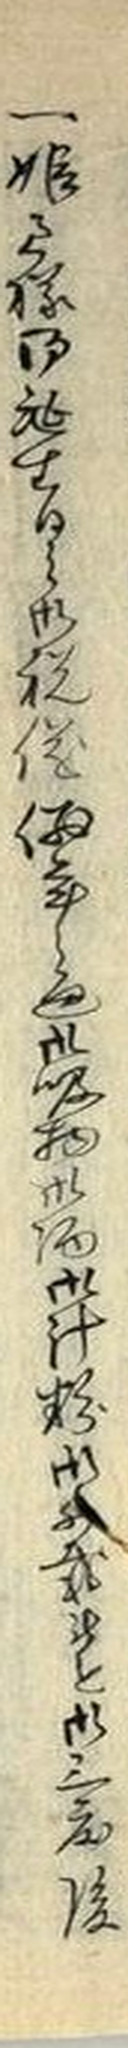一姫君様御誕生日之御祝儀例年之通御吸物御酒御汁粉御被進御三度後
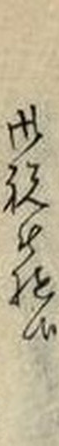御祝被遊候
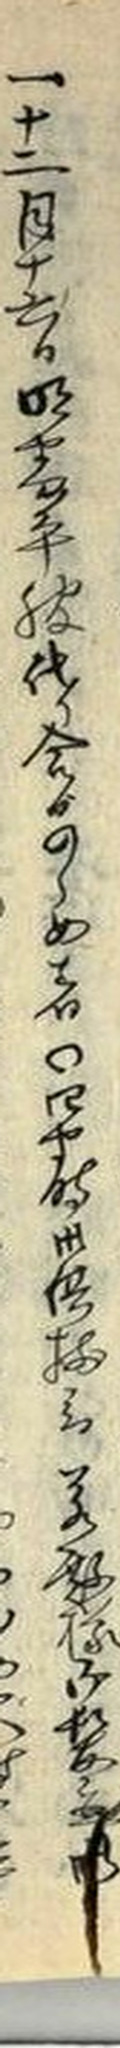一十二月十六日明番平服代り合ゟのしめ着〇四半時御供揃ニ而若殿様御髪置御
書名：少傅日録抄（斉承付側向頭取日記、在府）
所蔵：福井県文書館 Fukui Prefectural Archives
